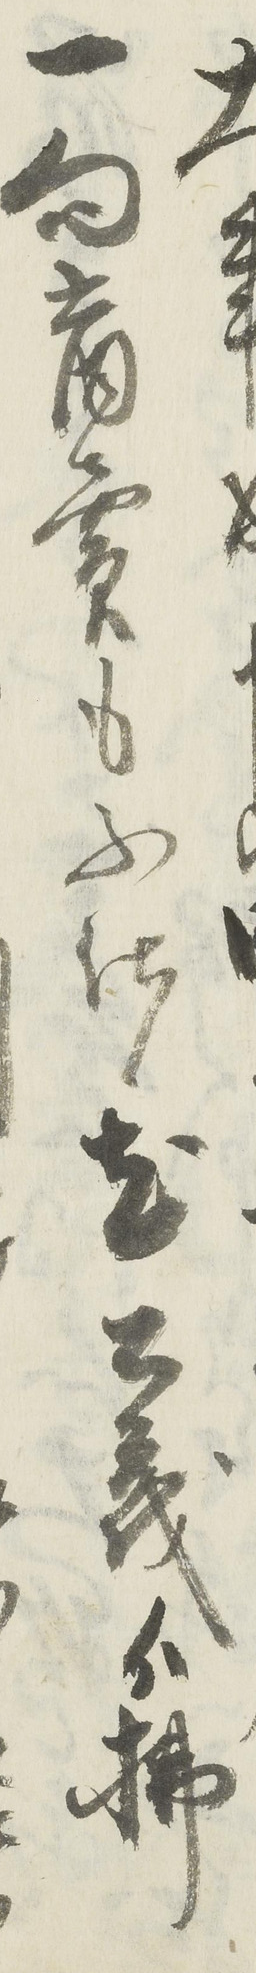一向商売も不仕候尤公義ゟ払
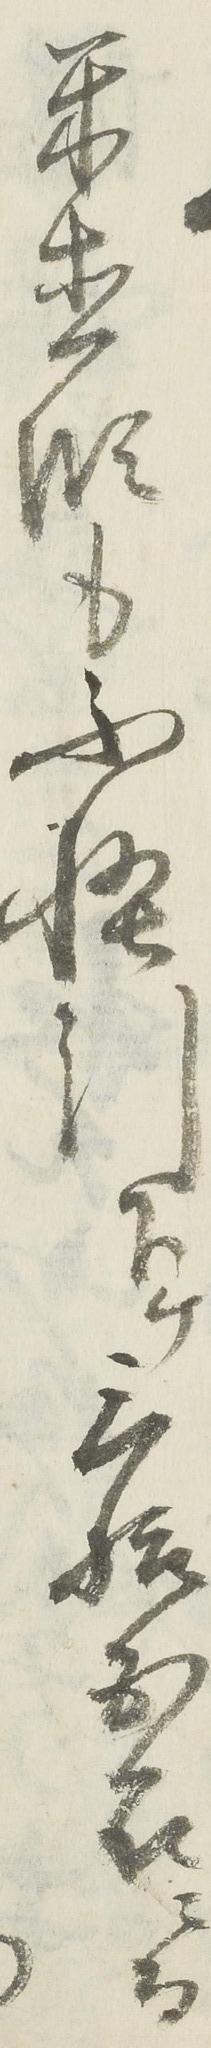米直段も不軽引下ケ三拾五石ニ而
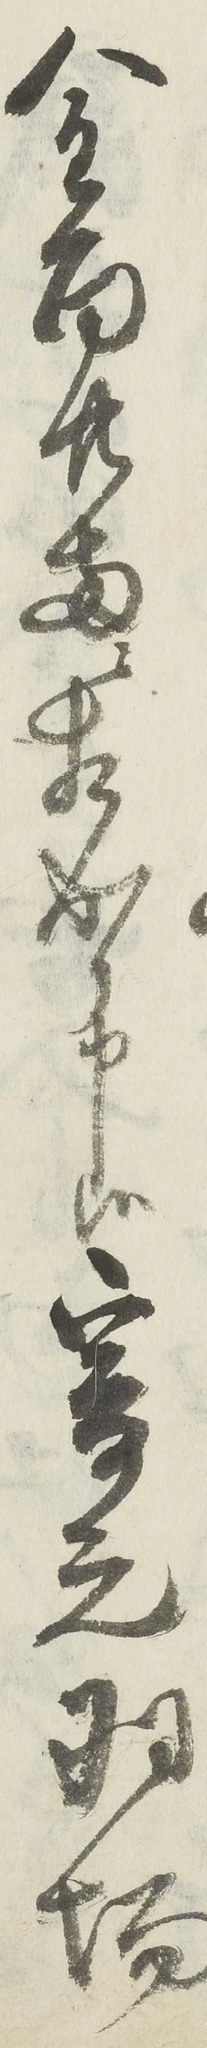金百廿両ニ相成り申候寄元相場
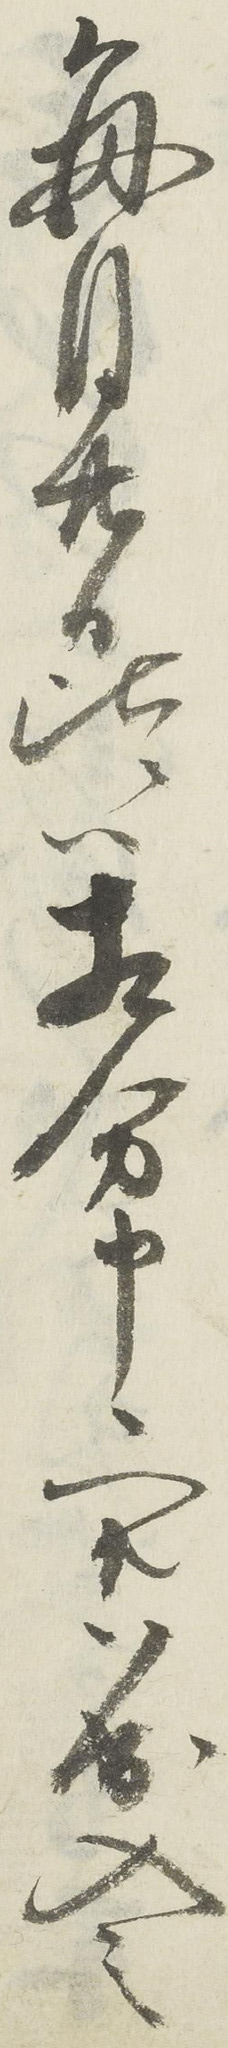毎月廿日頃ニは相分申候へ共御出入之

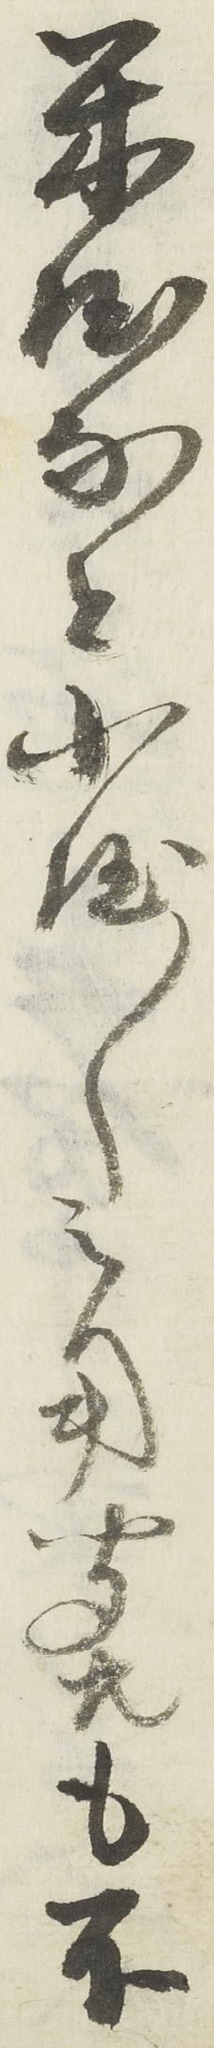米屋なと小屋〳〵之用聞共も不
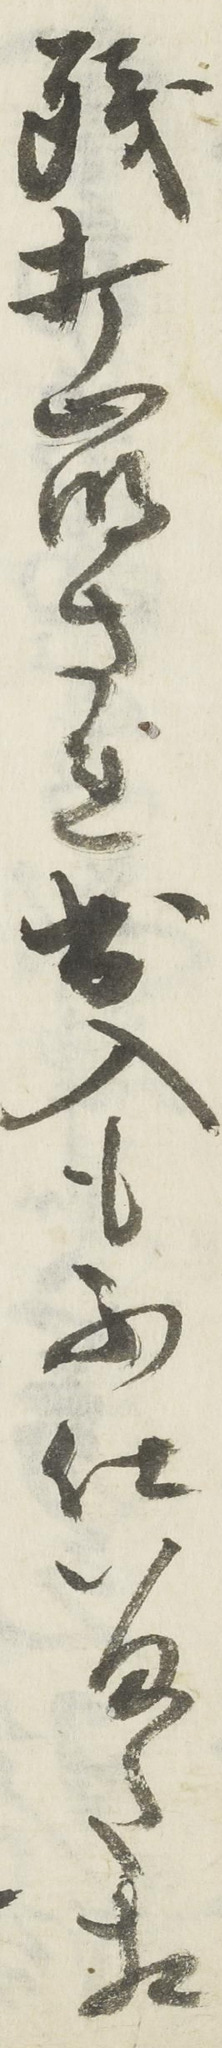残打崩され出入も不仕いまた相
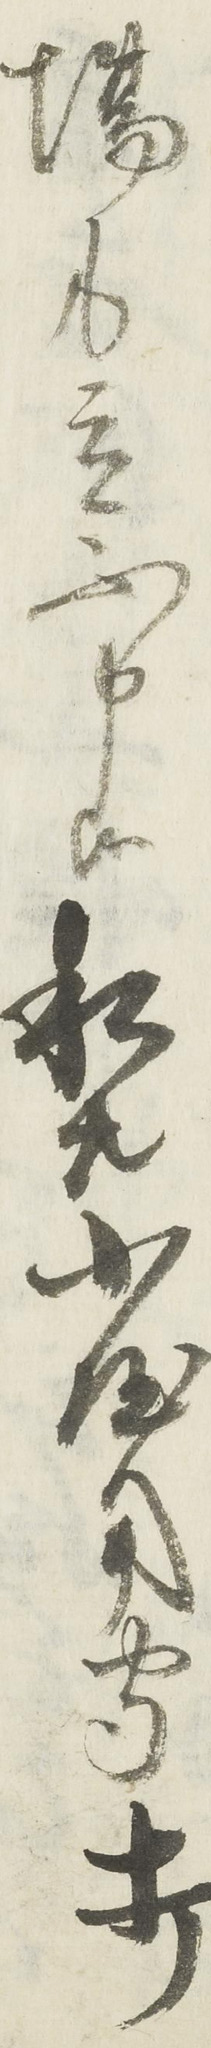場も立不申候私共小屋用聞打
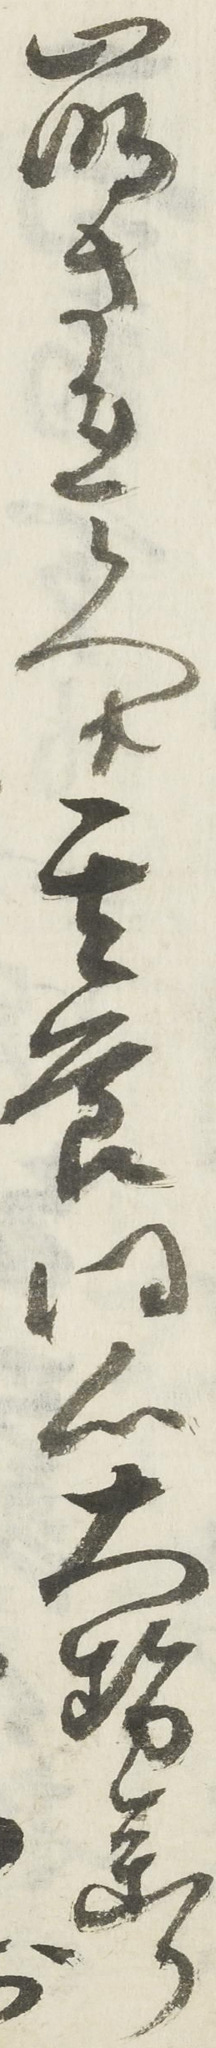崩され候へ共其節同心大勢参り
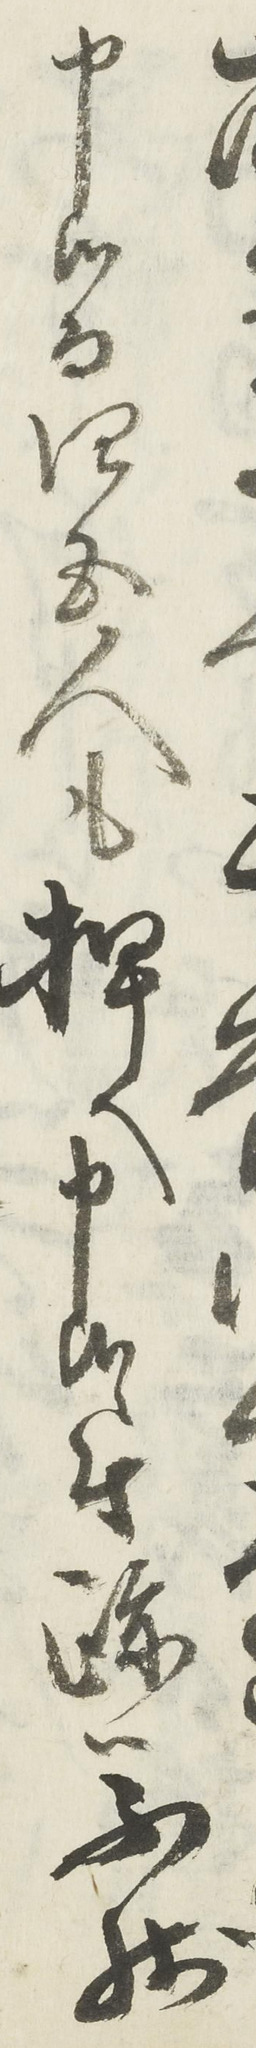申候而四五人も押へ申候付跡は不残
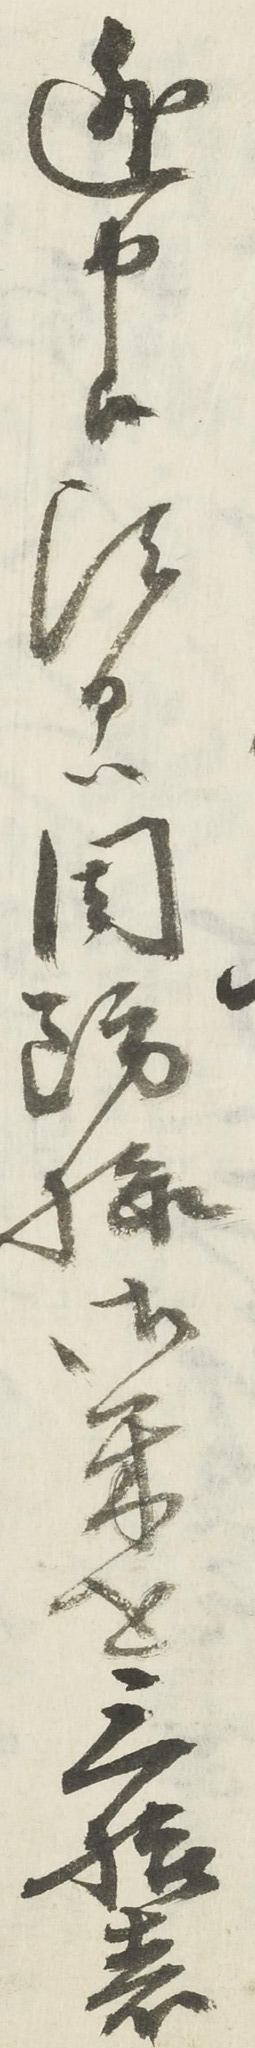逃申候頃日は周防様御米を三拾表
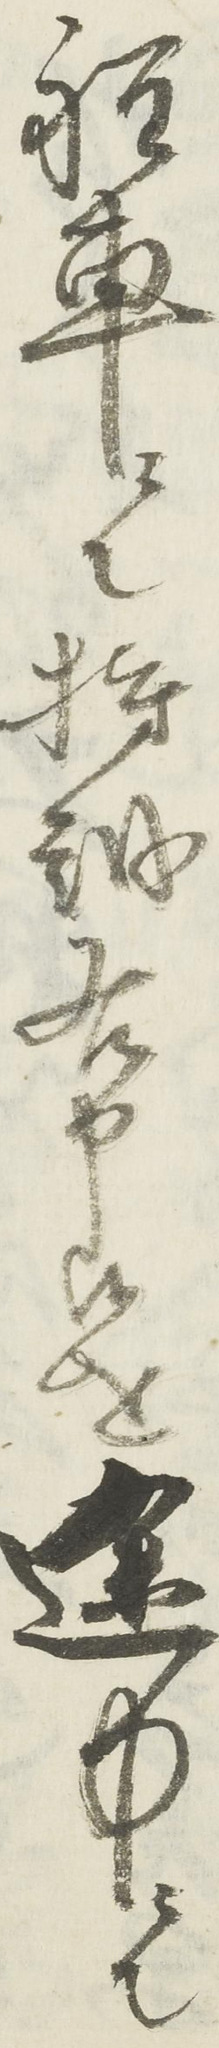程車ニて持越居申候を途中ニて
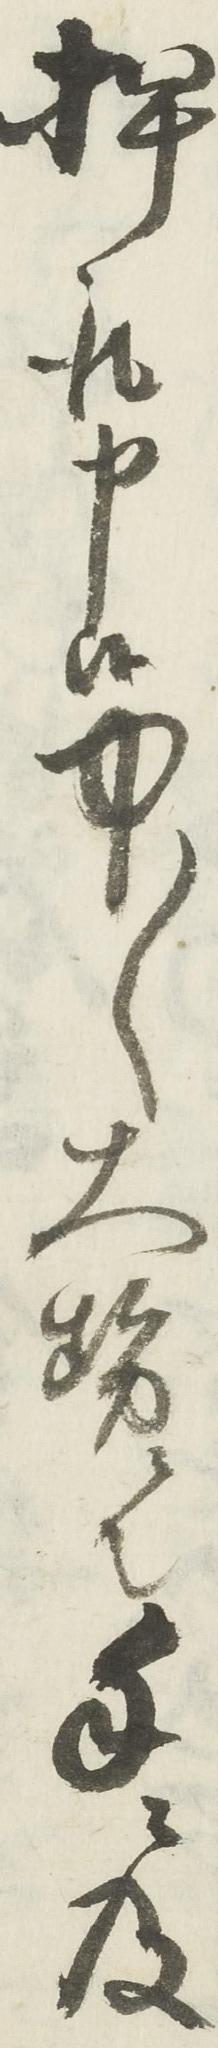押取申候中〳〵大勢ニて手ニ及
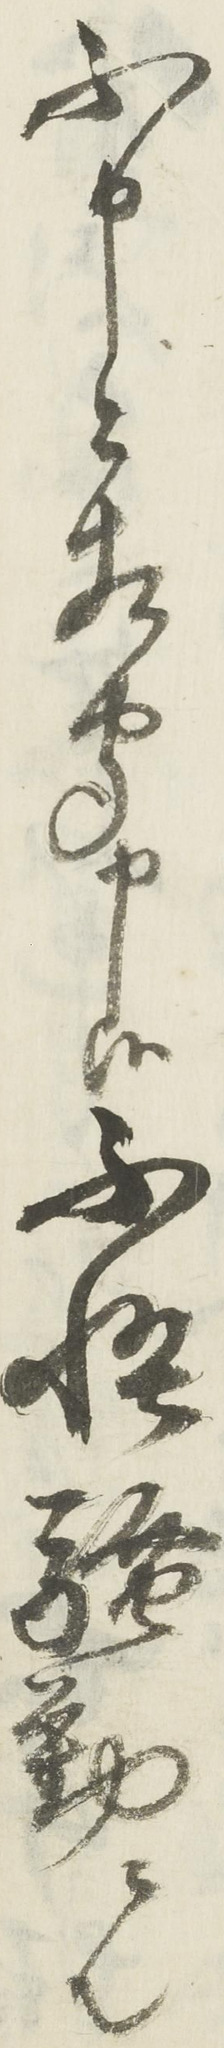不申と相聞申候不軽騒動ニて
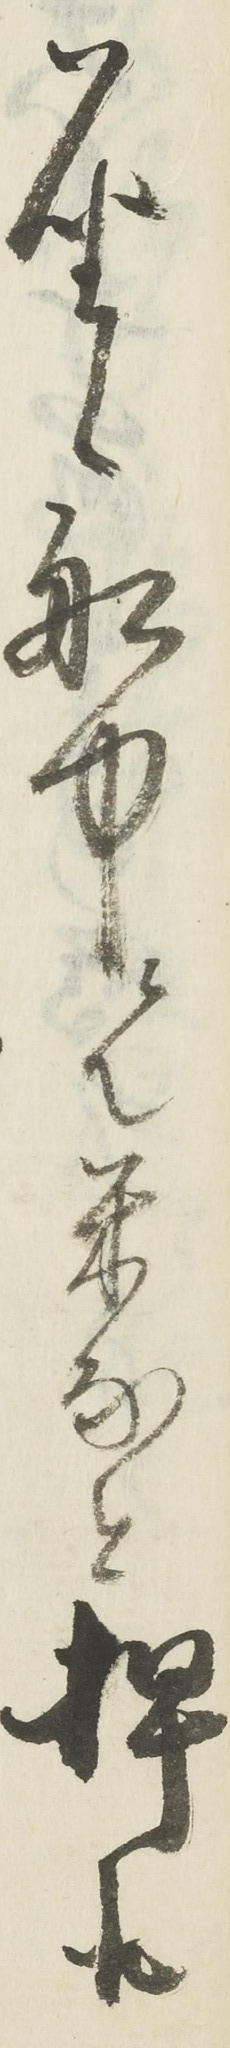御坐候船中ニて米なと押取
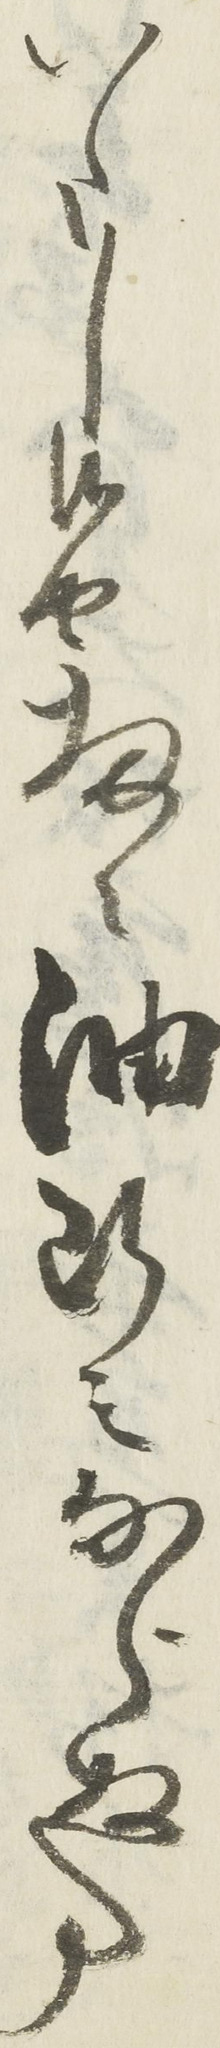いたし候由扨〻油断之ならぬ事
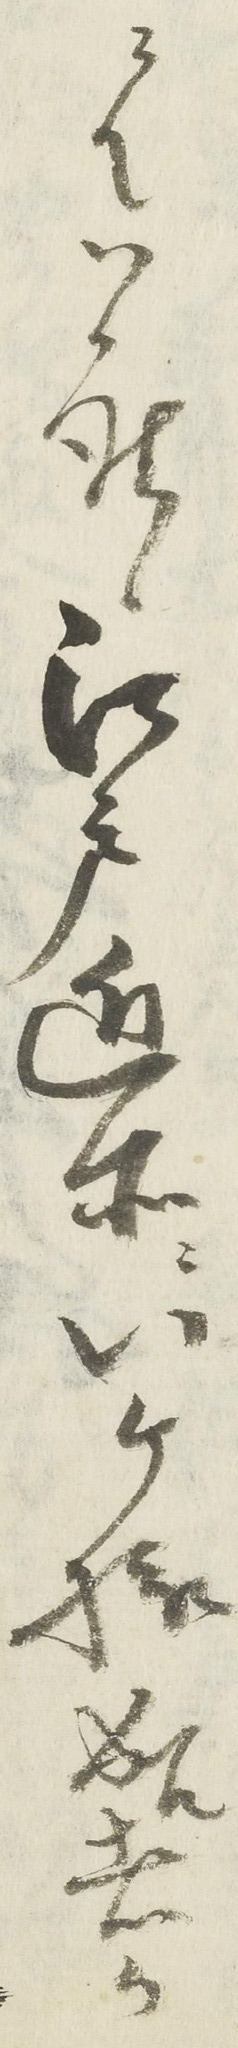ニて御座候江戸近所ニいヶ様成ル者か
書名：後見笑
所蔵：東京大学地震研究所図書室 Earthquake Research Institute Library, The University of Tokyo, JAPAN
